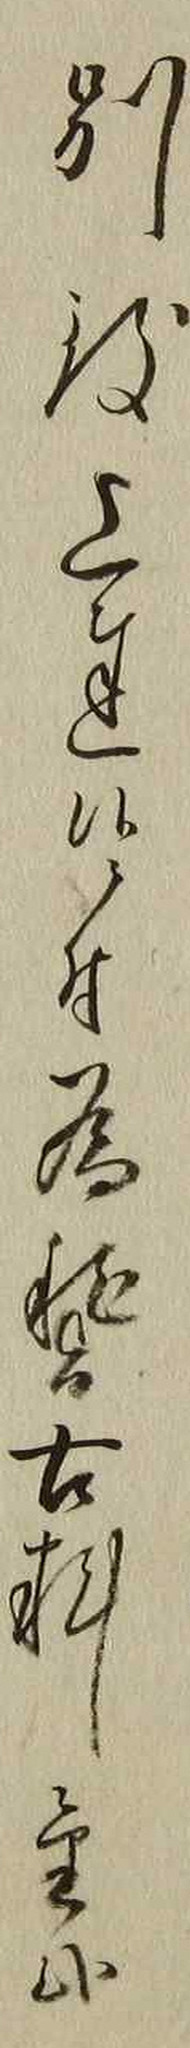別致上達候ニ付為稽古料金弐
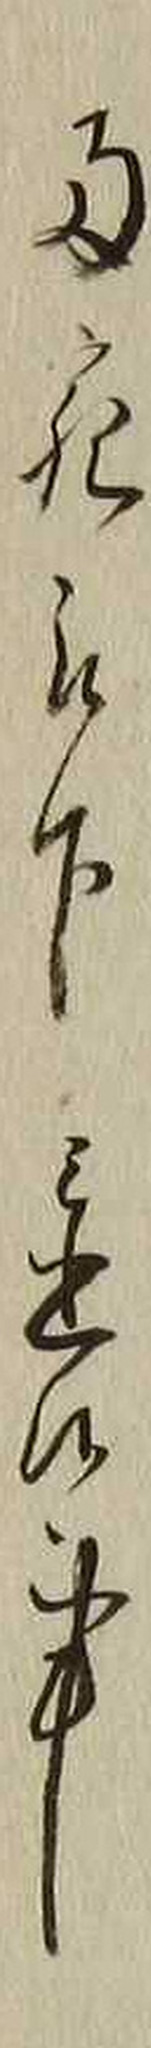両宛被下置候事
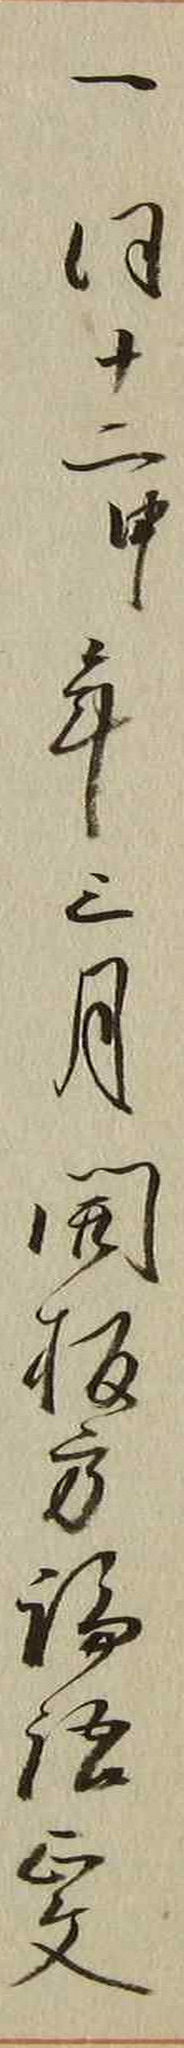一同十二申年三月開板方論語正文
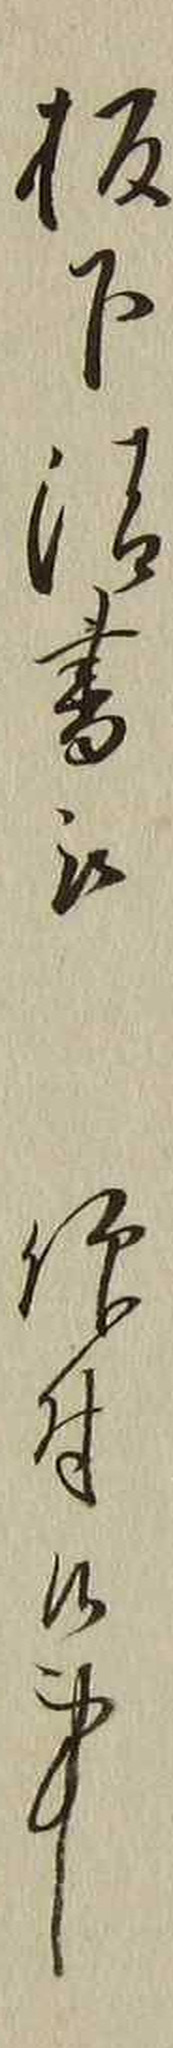板下清書被仰付候事
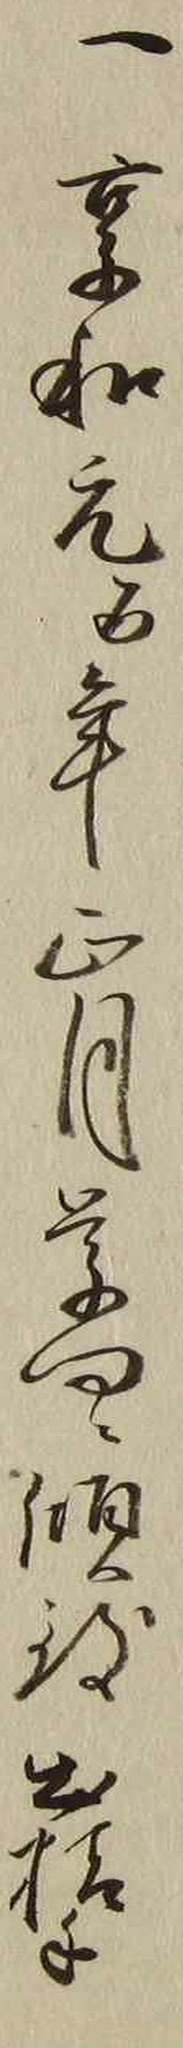一享和元酉年正月学問ニ傾致出精手
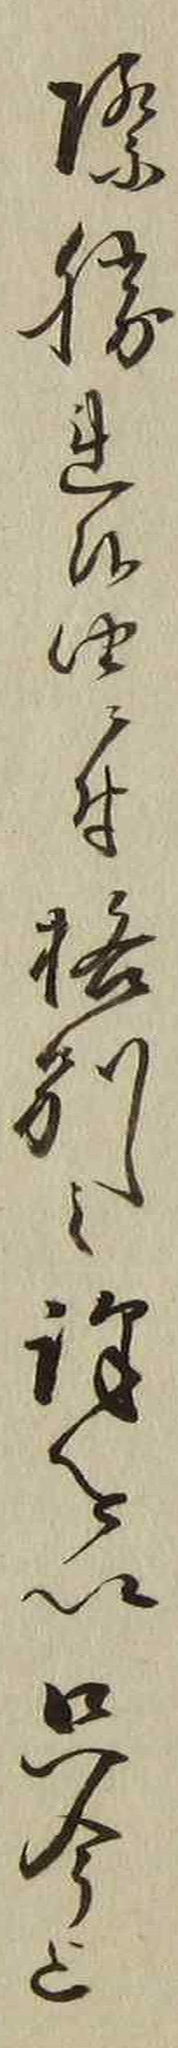際勝れ候由ニ付格別之訳を以只今迄
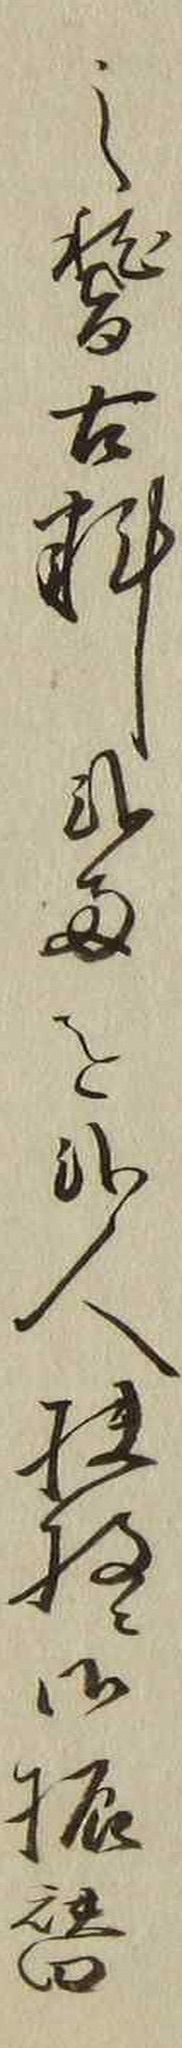之稽古料弐両を弐人扶持ニ御振替
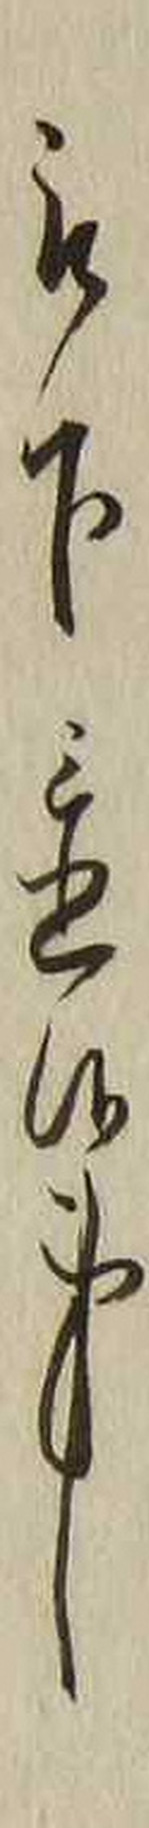被下置候事
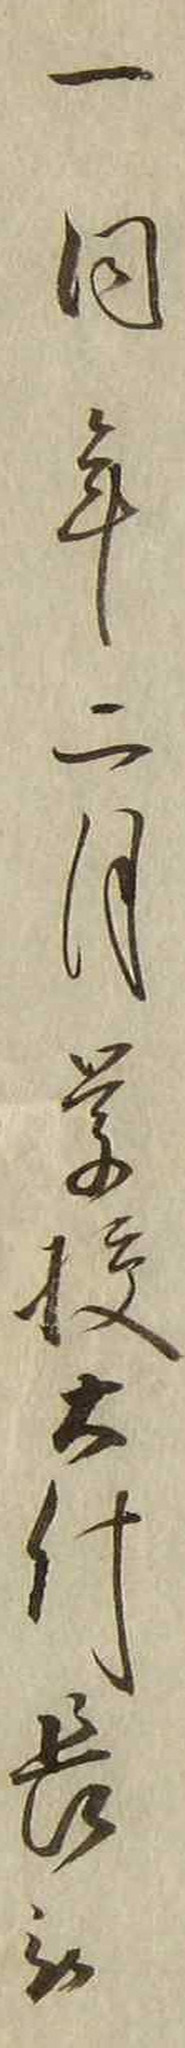一同年二月学校大什長被

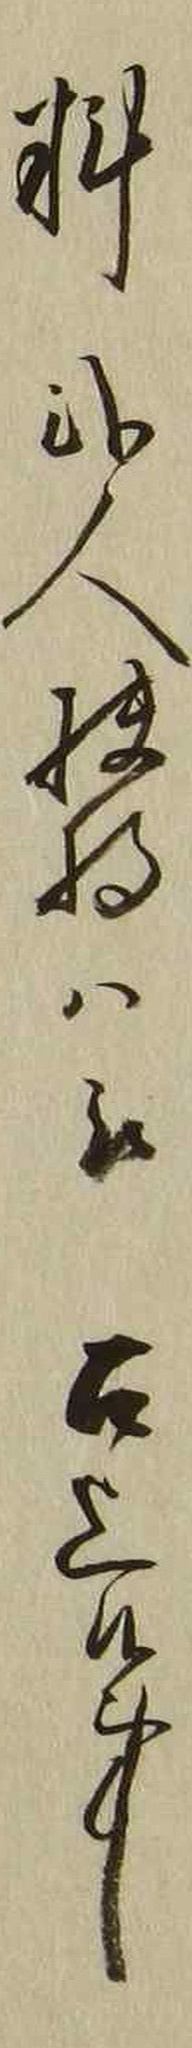料弐人扶持ハ被召上候事
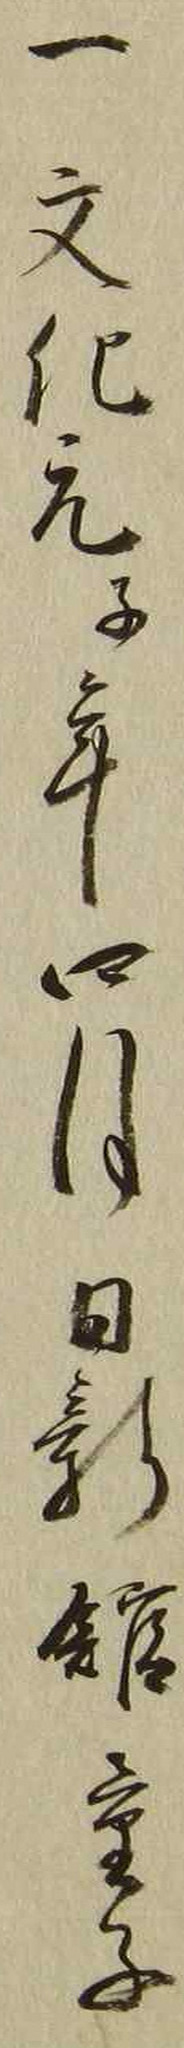一文化元子年四月日新館童子
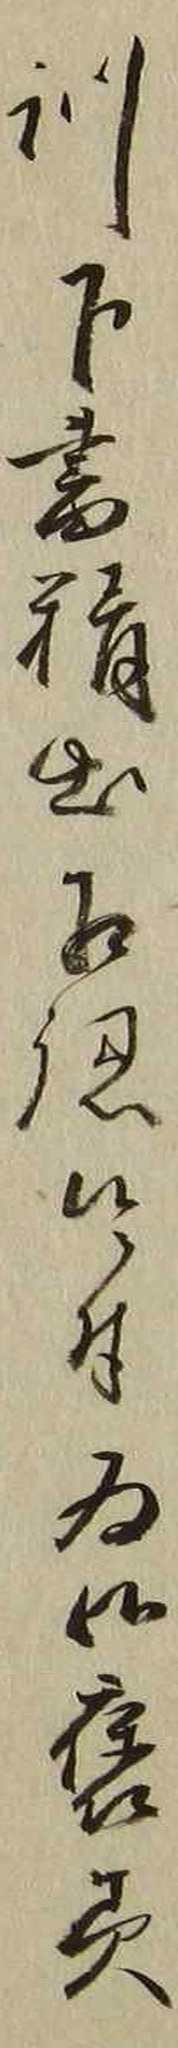訓下書精出相認候ニ付為御褒美
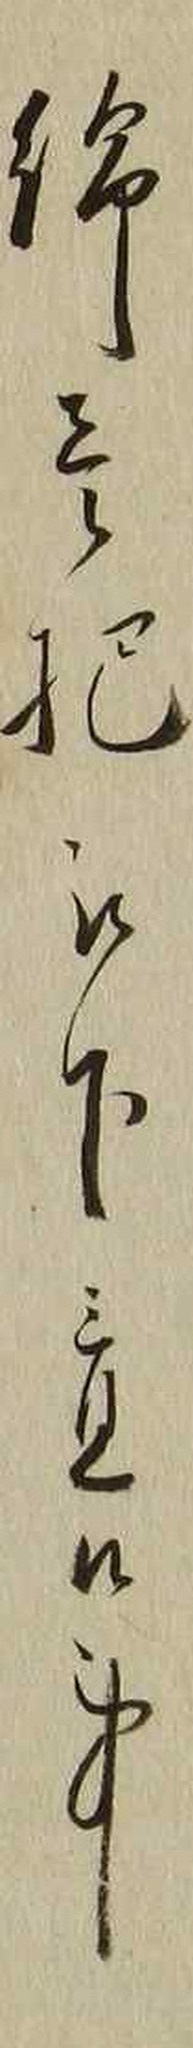綿壱把被下置候事
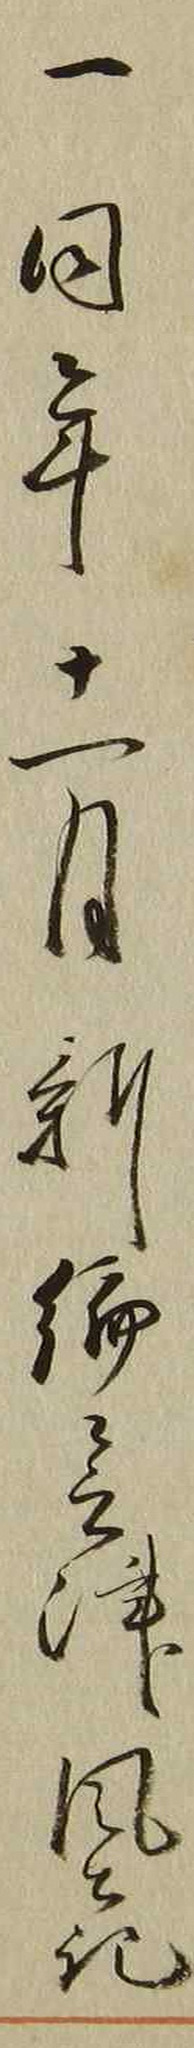一同年十一月新編会津風と記
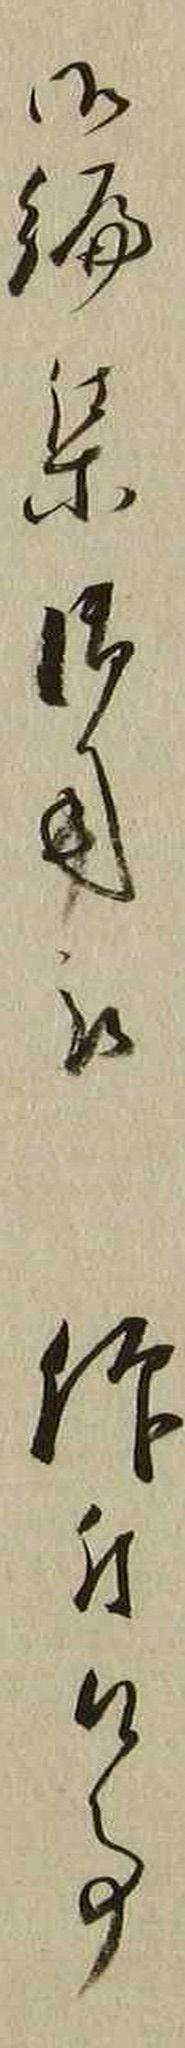御編集御用被仰付候事
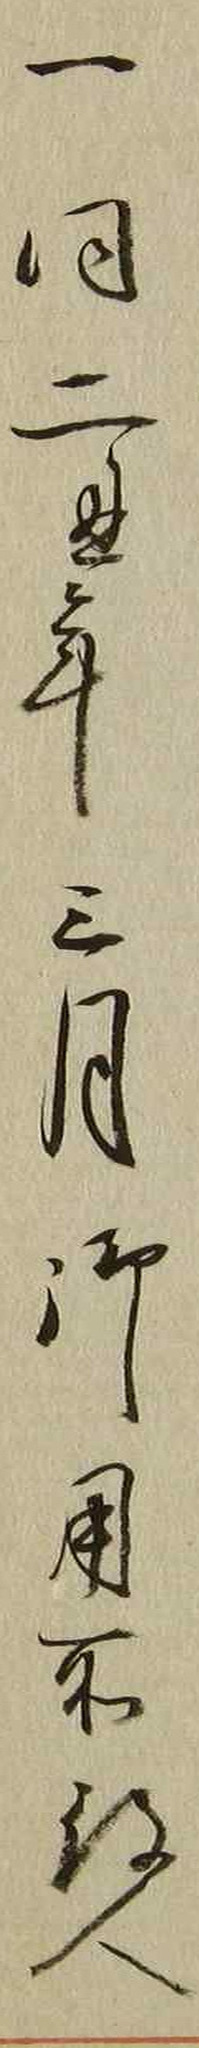一同二丑年三月御用所役人
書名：諸士系譜　巻之68　を之部2
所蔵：会津若松市立会津図書館
